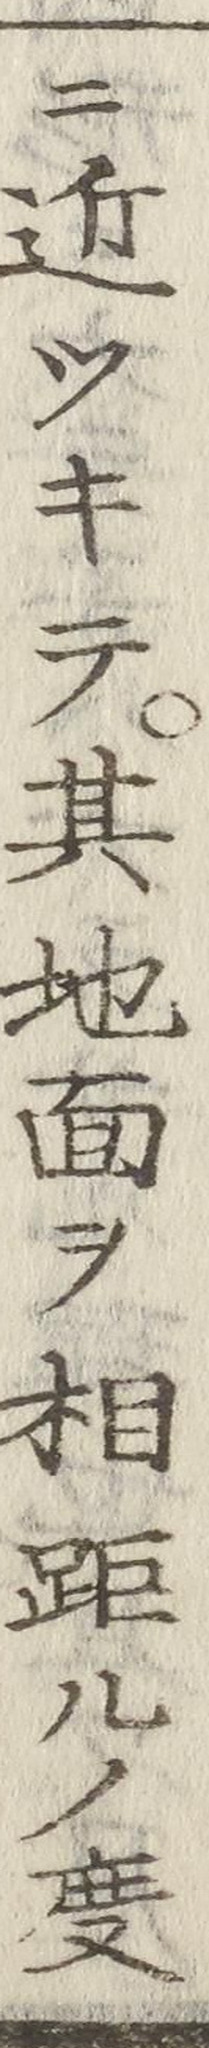ニ近ツキテ。其地面ヲ相距ルノ度
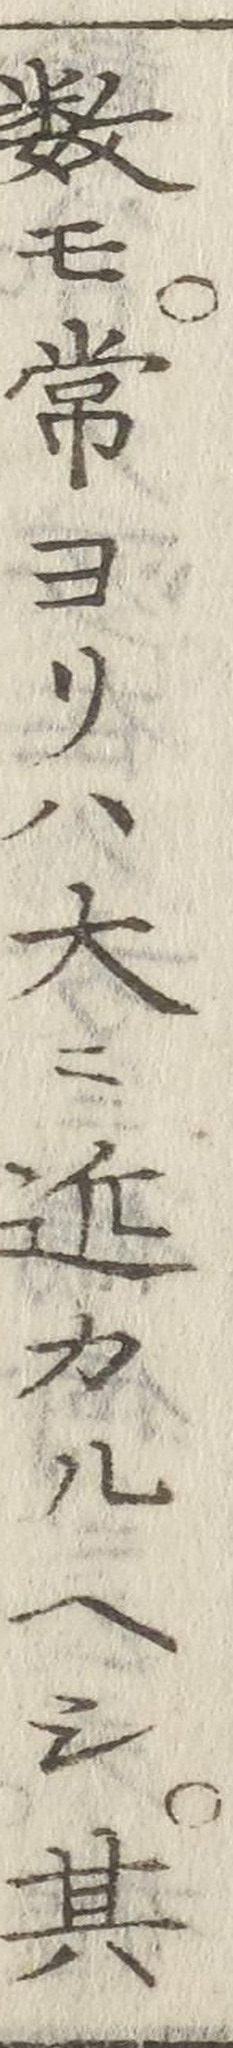数モ。常ヨリハ大ニ近カルヘシ。其
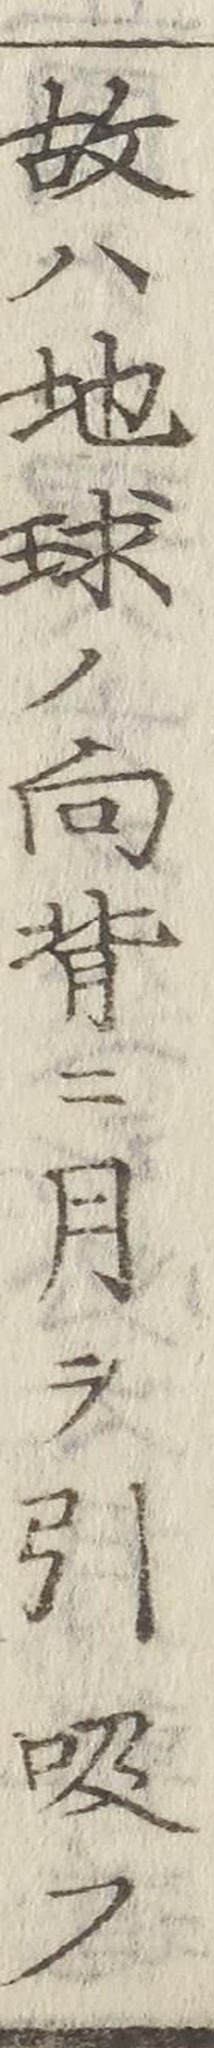故ハ地球ノ向背ニ月ヲ引吸フ
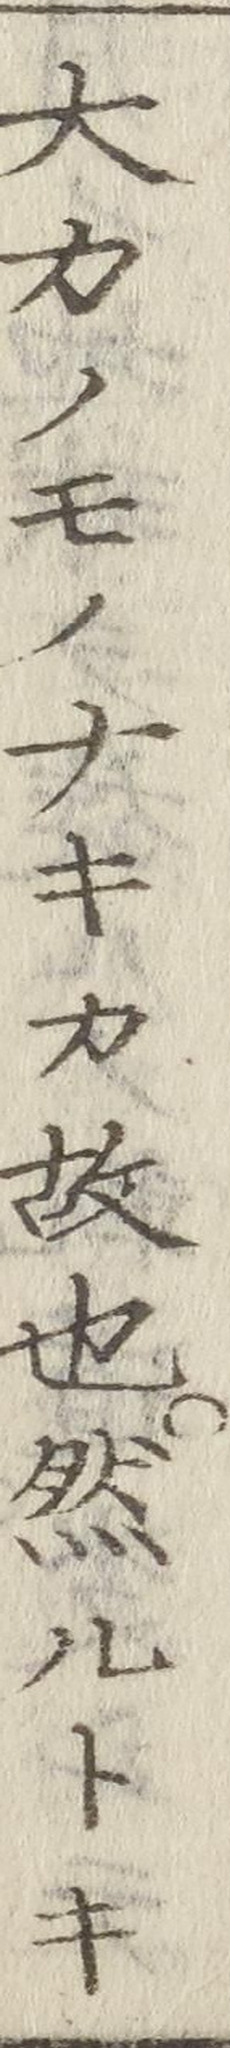大カノモノナキカ故也。然ルトキ

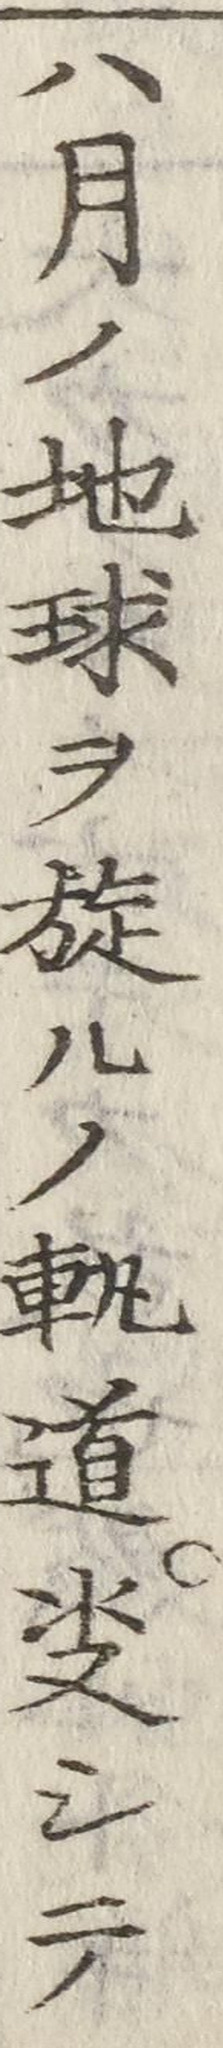ハ月ノ地球ヲ旋ルノ軌道。叟シテ
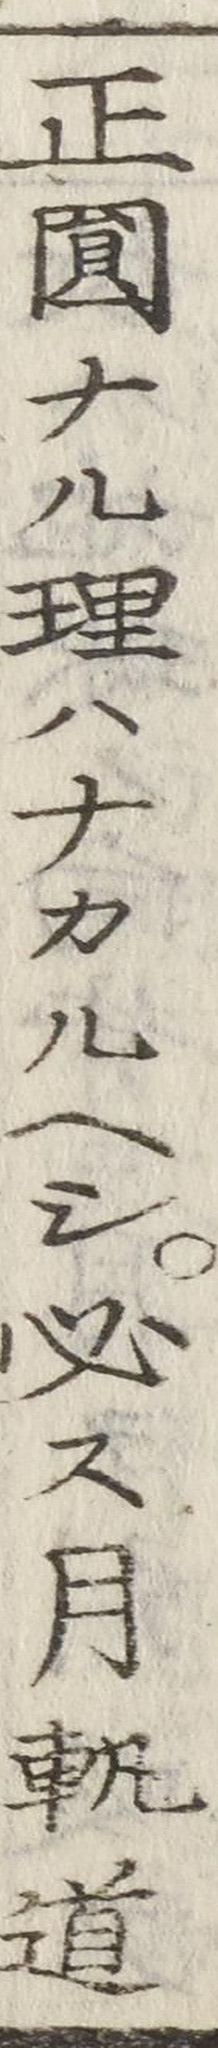正円ナル理ハナカルヘシ。必ス月軌道
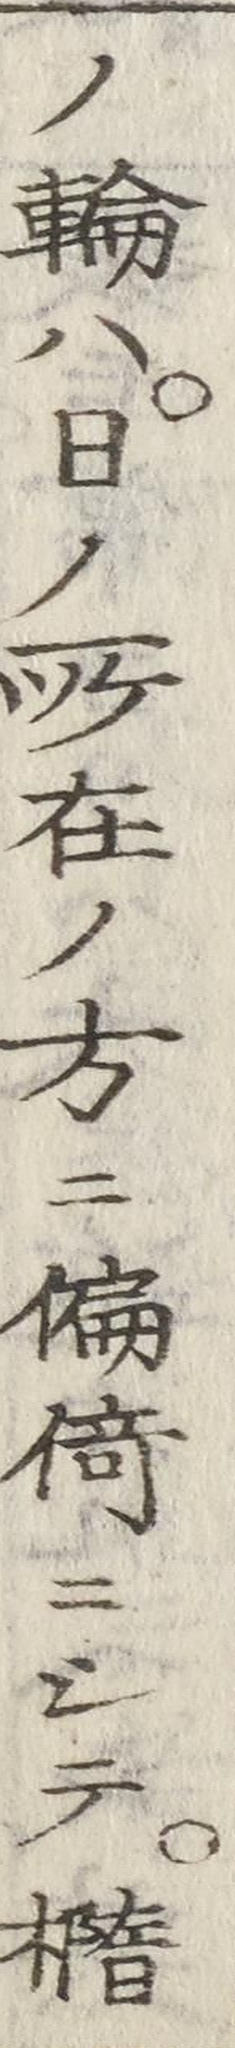ノ輪ハ。日ノ所在ノ方ニ偏倚ニシテ。憜
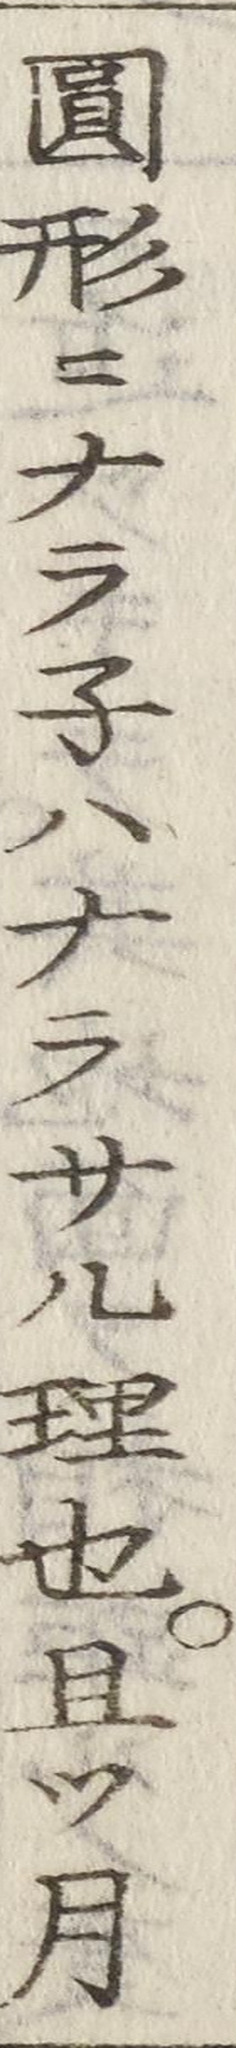円形ニナラネハナラサル理也。且ツ月
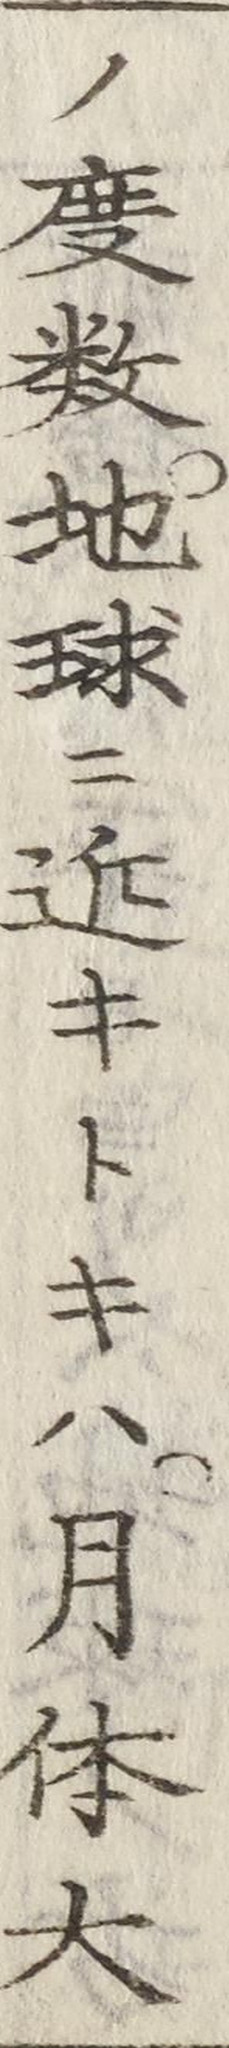ノ度数。地球ニ近キトキハ。月体大
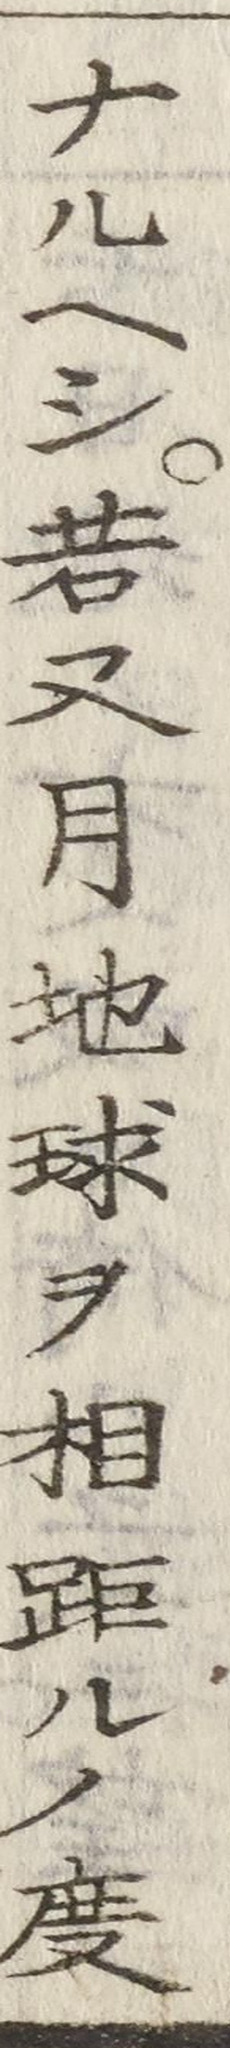ナルヘシ。若又月地球ヲ相距ルノ度
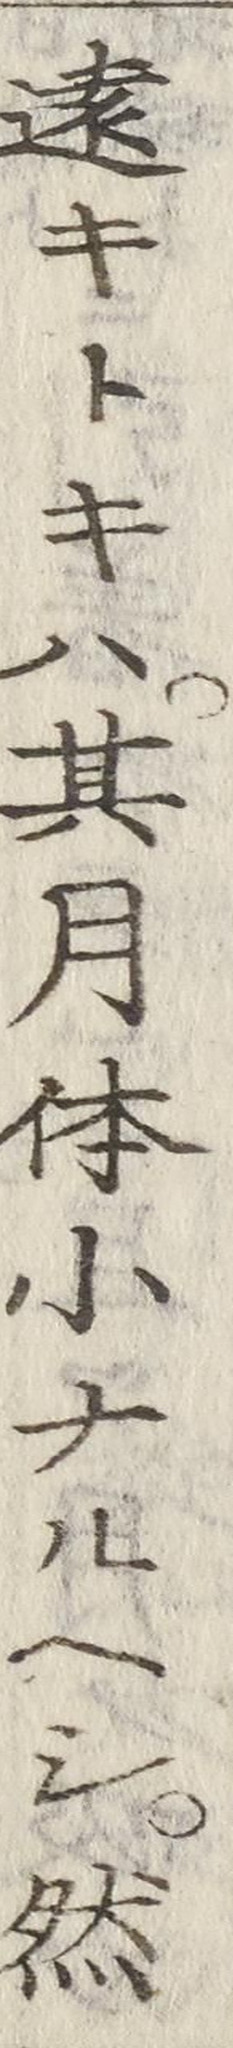遠キトキハ。其月体小サキコト星
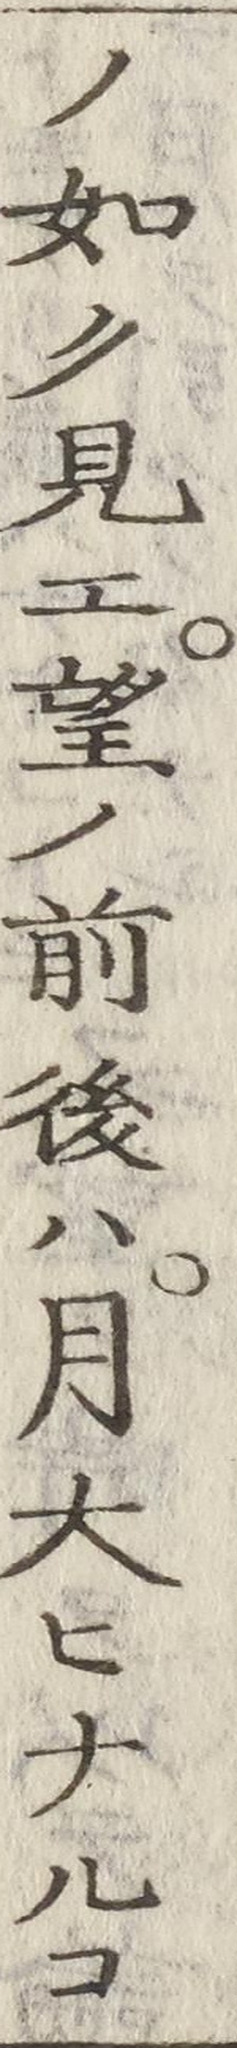ノ如ク見エ。望ノ前後ハ。月大ヒナルコ
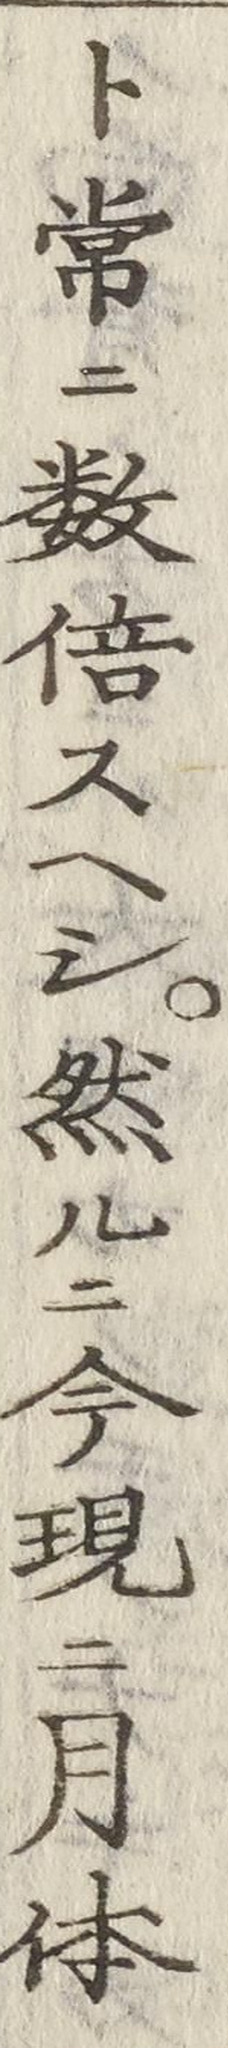ト常ニ数倍スヘシ。然ルニ今現ニ月体
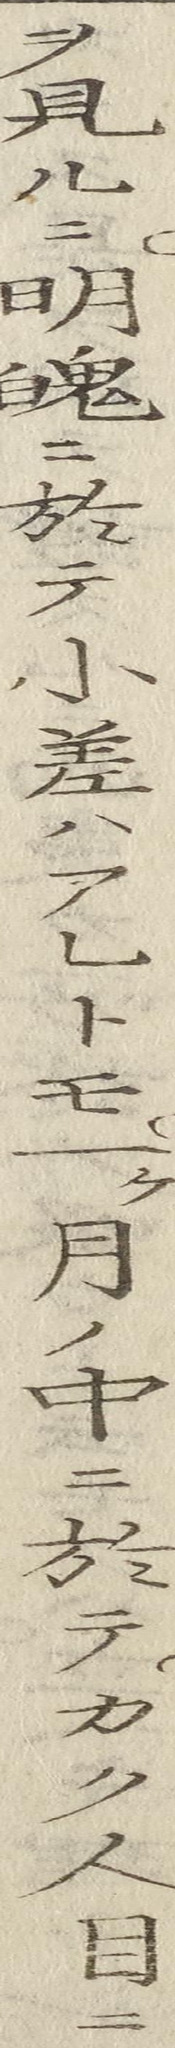ヲ見ルニ。明魄ニ於テ小差ハアレトモ。一ヶ月ノ中ニ於テ。カク人目ニ
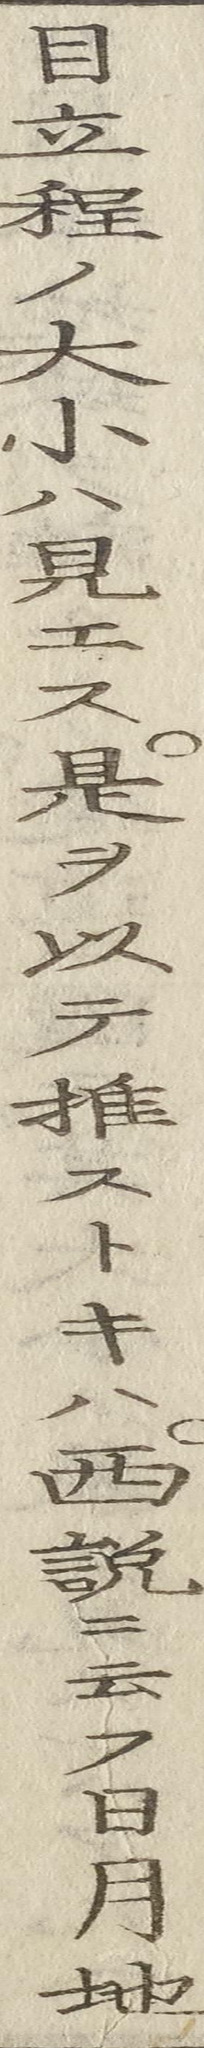目立程ノ大小ハ見エス。是ヲ以テ推ストキハ。西説ニ云フ日月地
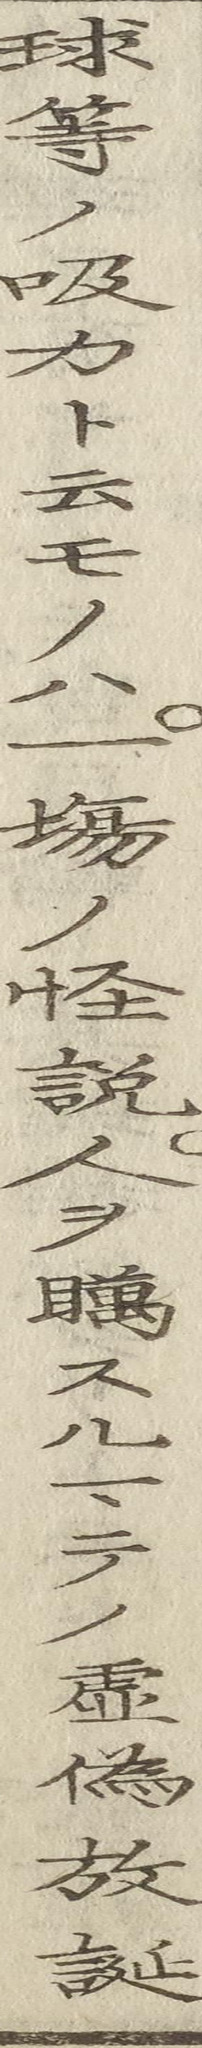球等ノ吸カト云モノハ。一場ノ怪説。人ヲ𥈋スルマテノ虚偽放誕
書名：護法新論　中
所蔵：東京大学地震研究所図書室 Earthquake Research Institute Library, The University of Tokyo, JAPAN
